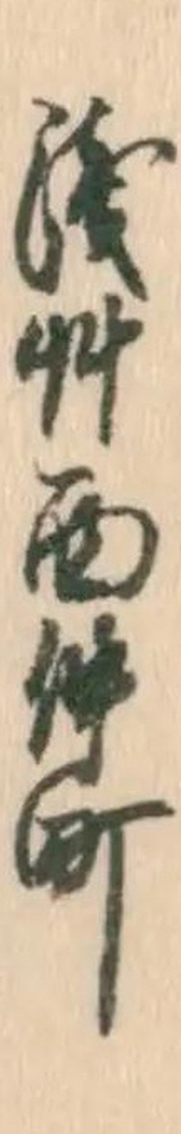浅草西仲町
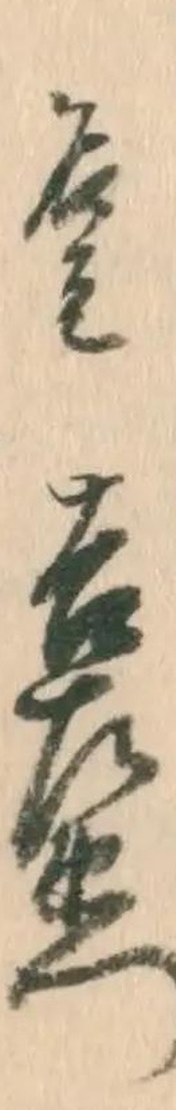名主吉左衛門
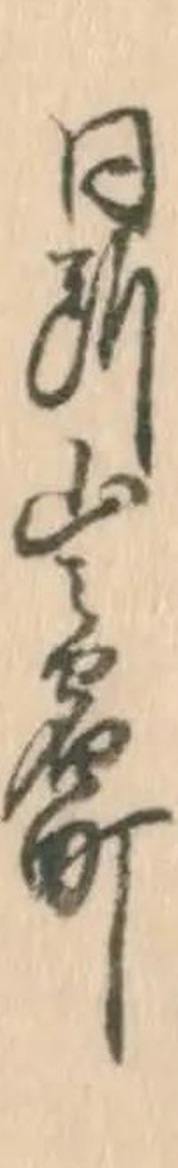同所山之宿町
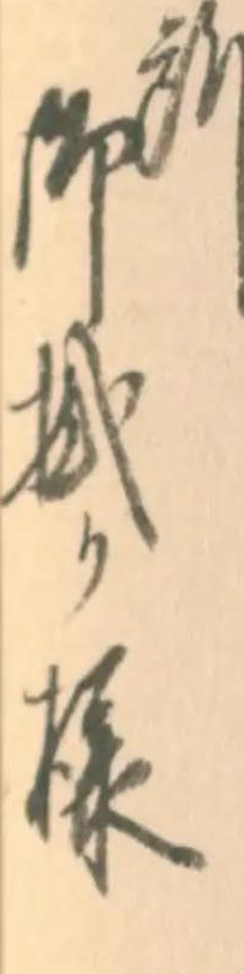御掛り様
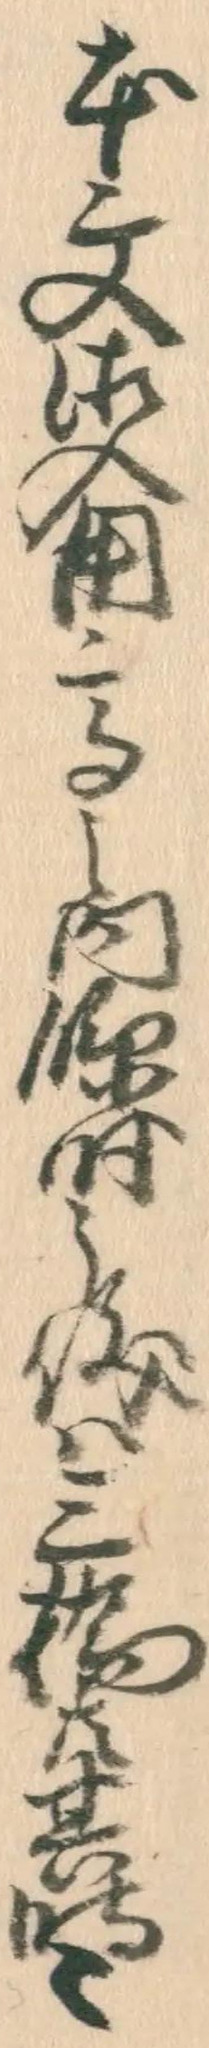本文御入用高之内臨時之儀ハ三橋共其時々
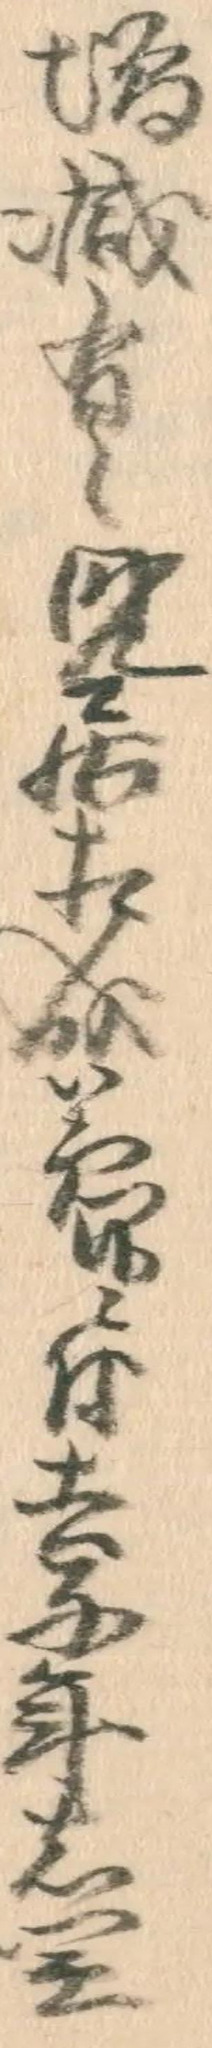増減有之見居相成兼候ニ付去子年は閏
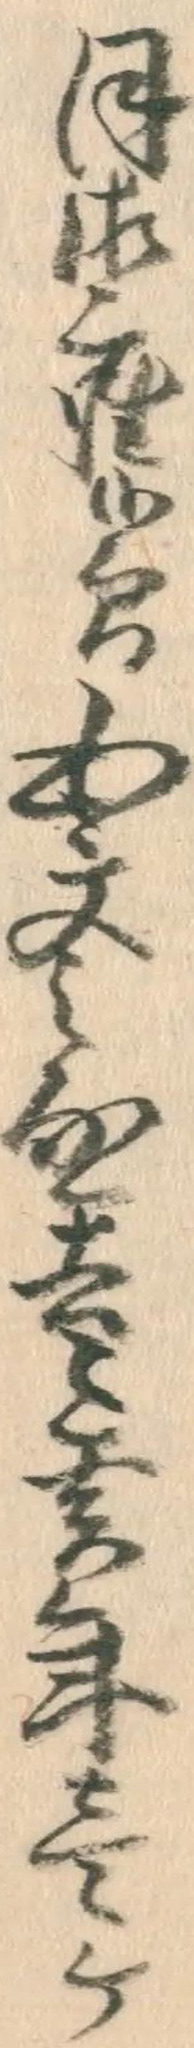月御座候間本文之通去々亥年壱ケ
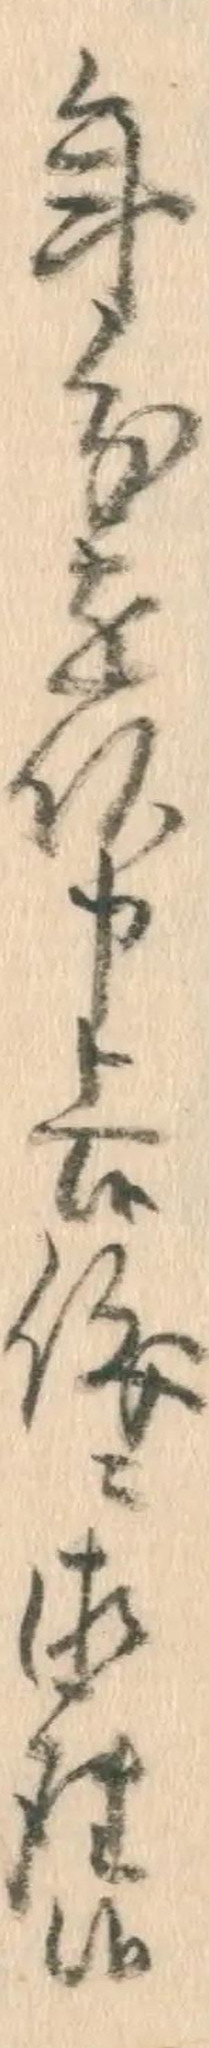年分を以申上候儀ニ御坐候

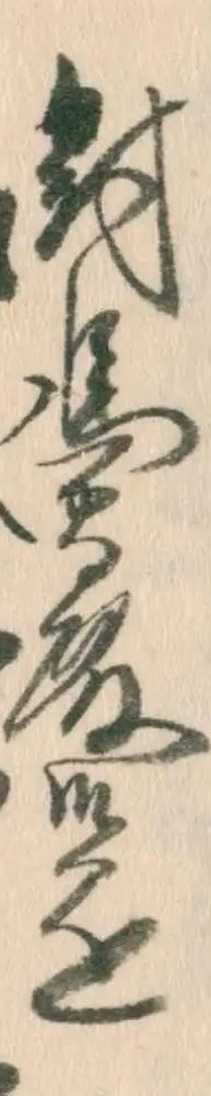対馬守殿御懸
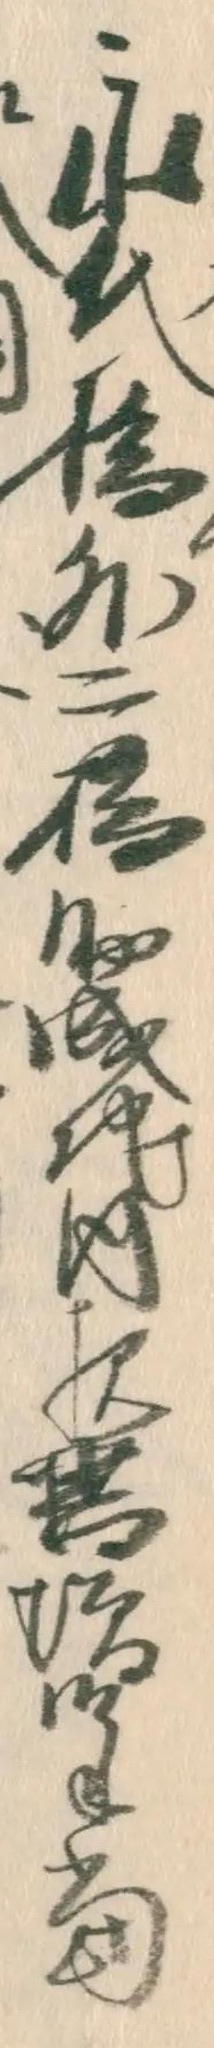永代橋外二橋助成地内夜番増御手当
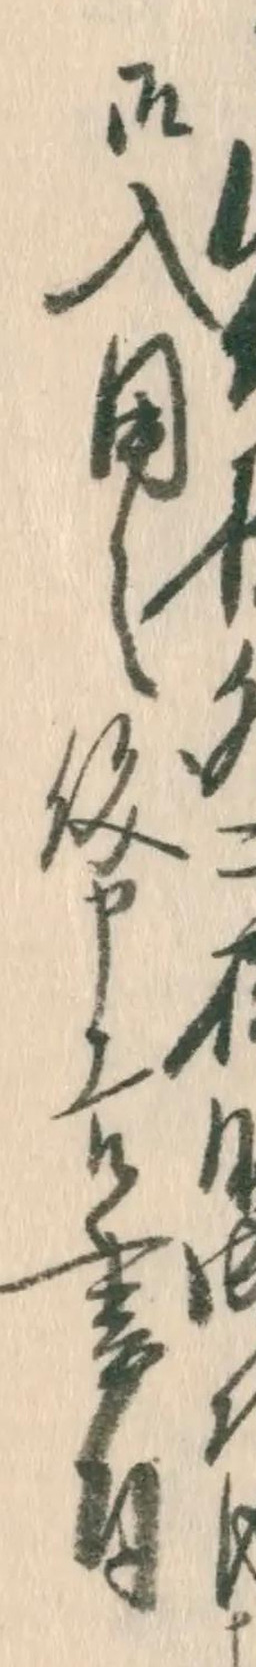御入用之儀申上候書付
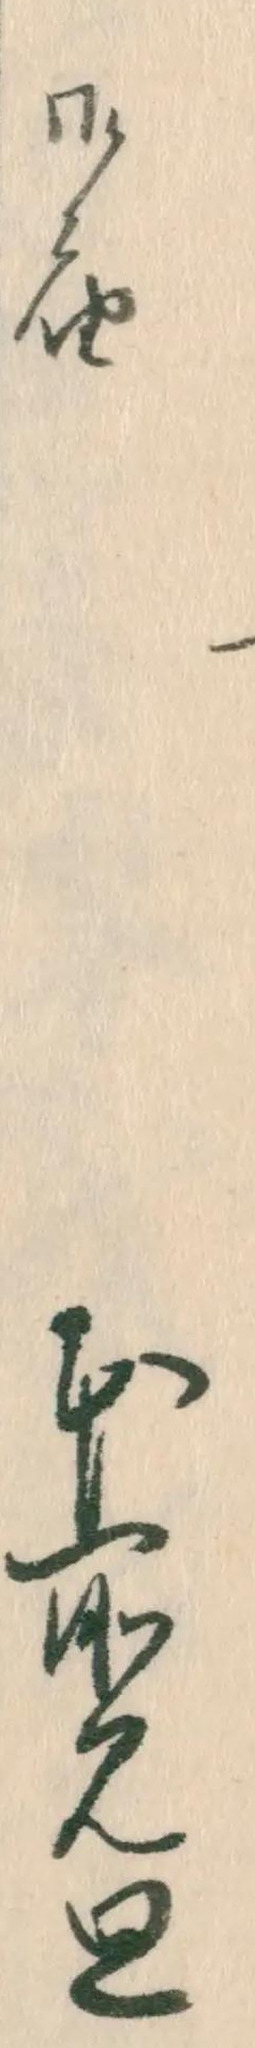御届本所見廻
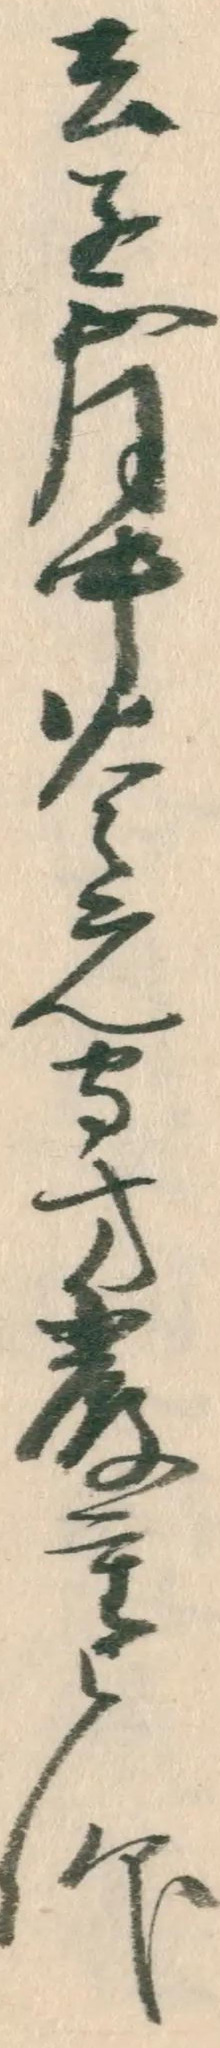去子正月中火之元守方厳重被仰
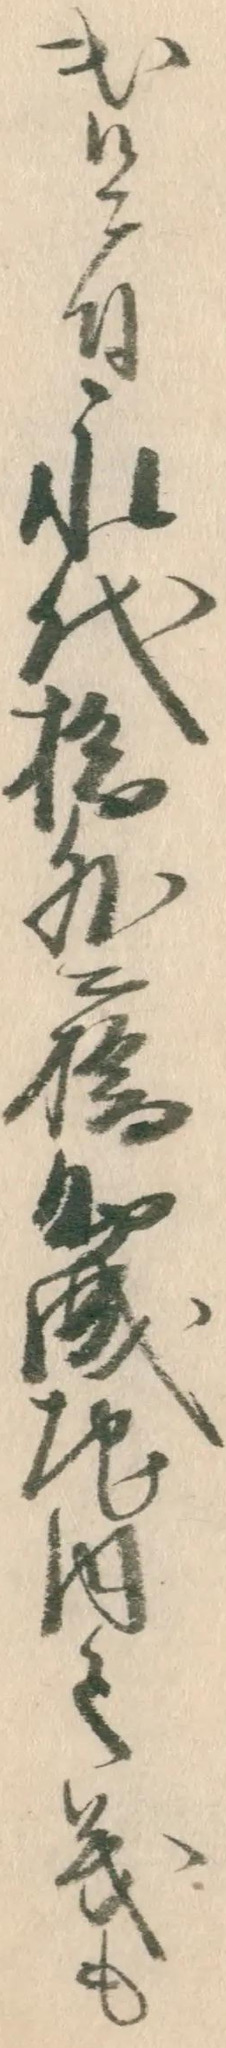出候ニ付永代橋外二橋助成地内之義も
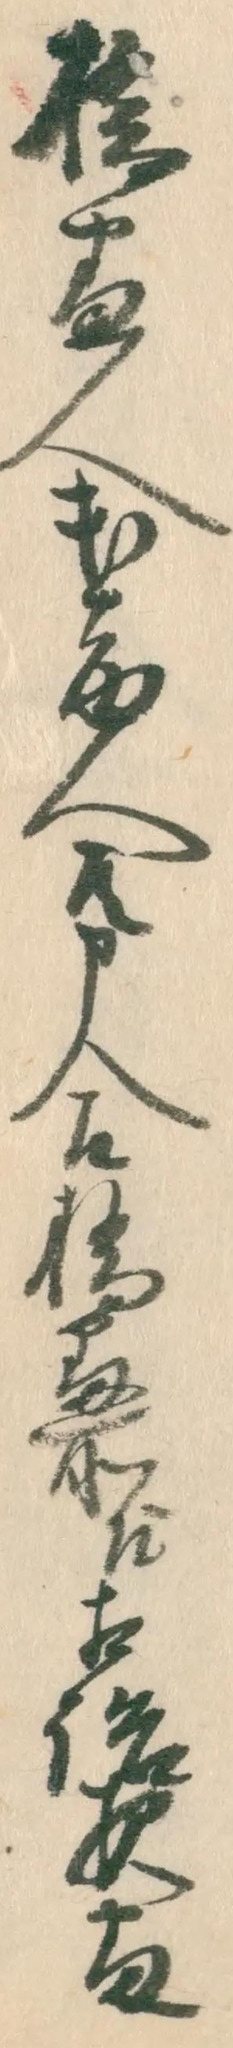橋番人出商人共申合橋番所え相詰夜番

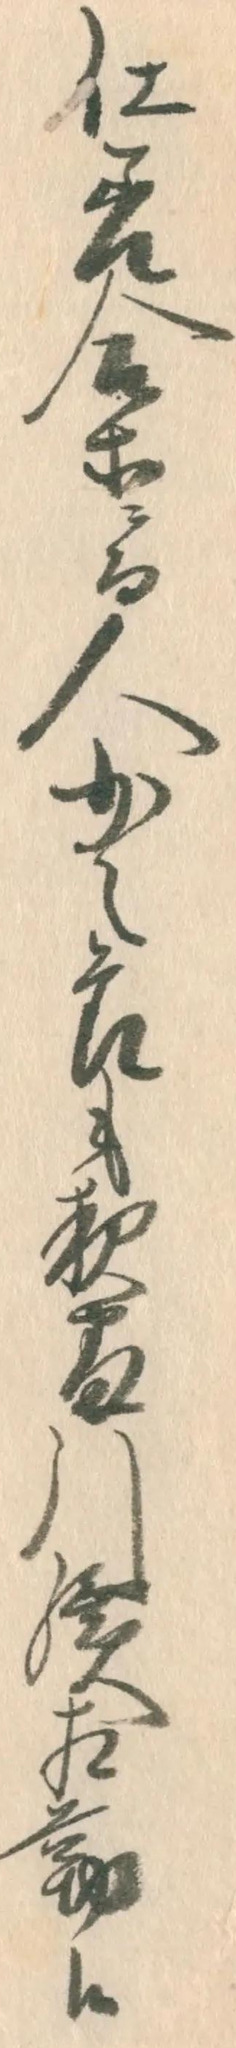仕差合等ニ而人少之節も夜番引続相勤候
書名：三橋 17巻. [7] 三橋小破御修復書留　但御奉行御掛リ替地震潰橋番屋　嘉永四亥年より安政二卯年迄　上
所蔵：国立国会図書館 National Diet Library, JAPAN
